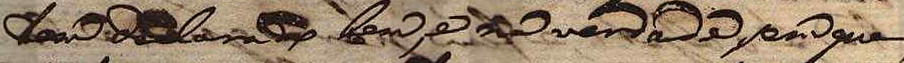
tem declarado bem, e na verdade, sem que
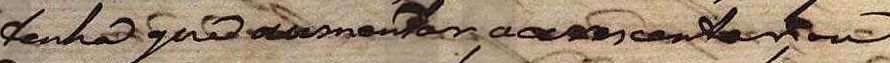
tenha que aumentar, acrescentar, ou
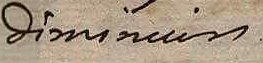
diminuir
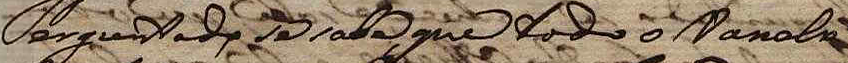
Perguntado se sabe que todo o Vassalo
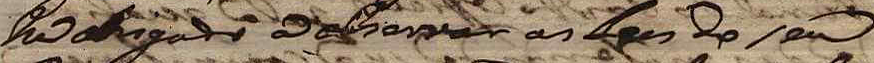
he obrigado a observar as Leis do seu
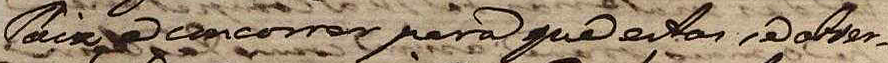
Paiz, e concorrer para que estas se obser
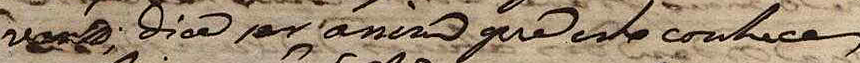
v__; dice ser assim que este conhece
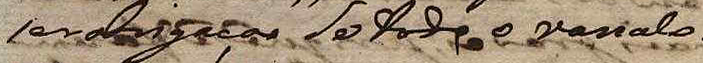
ser obrigaçaõ de todo o vassalo.
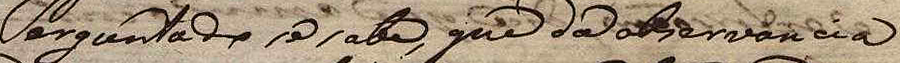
Perguntado se sabe, que da observancia
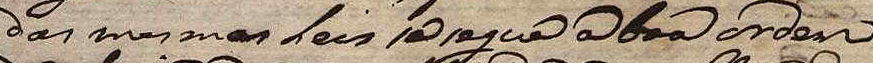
das mesmas Leis se segue a boa ordem
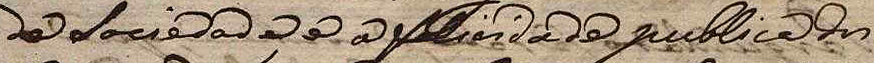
da Sociedade, e a felicidade publica dos
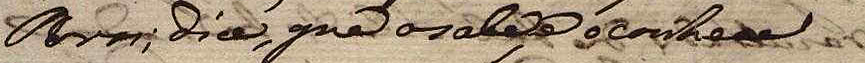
Povos; dice, que o sabe, e conhece
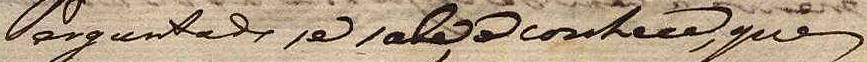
Perguntado se sabe, e conhece, que
